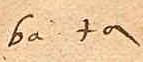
6a ta
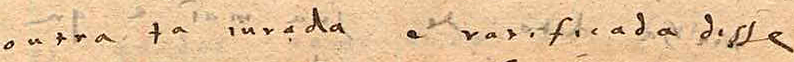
outra ta iurada e ratificada disse
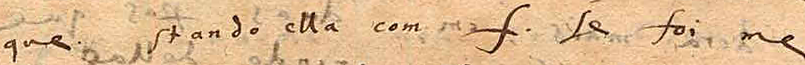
que stando ella co f. se foi me
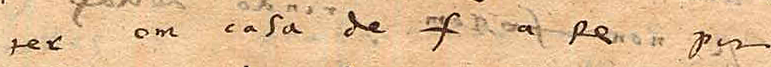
ter em casa de f a Re por
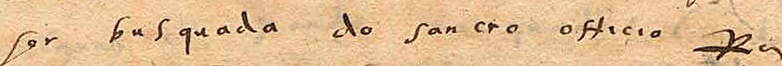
ser busquada do sancto offiçio ꝑa
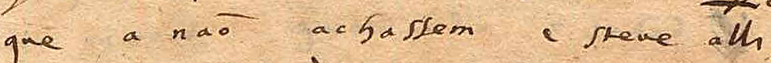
que a naõ achassem esteue alli
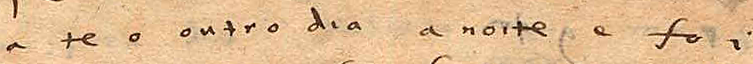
ate o outro dia a noite e foi
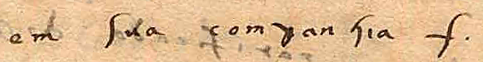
em sua companhia f.
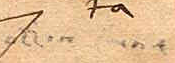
7 ta
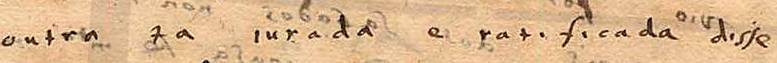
outra ta iurada e ratificada disse
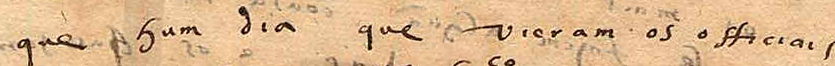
que hum dia que vieram os officiais
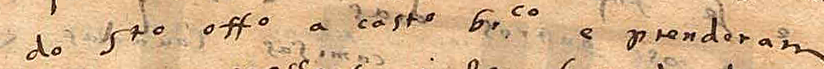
do sto offo a casto brco e prenderam
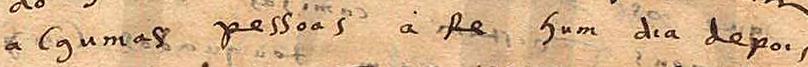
algumas pessoas ate hum dia depois
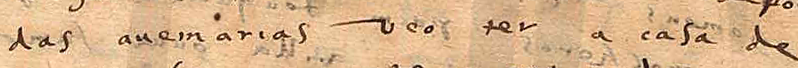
das aue marias veo ter a casa de
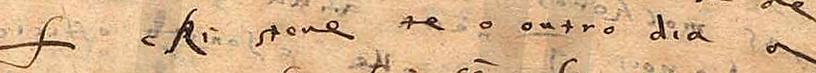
f e Re steue te o outro dia a
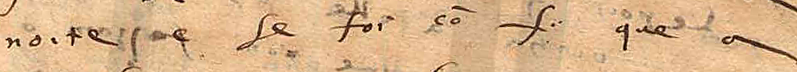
noite e se foi co̅ f. que a
